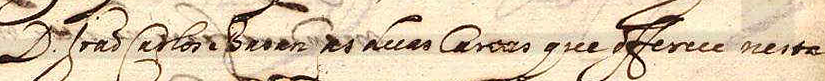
D. Joaõ Carlos Basan as duas Car_as que offerece nesta
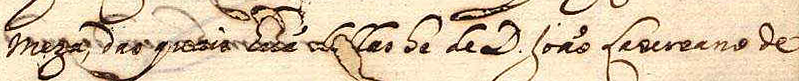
meza, das quais huā d_llas he de D. João Laureano de
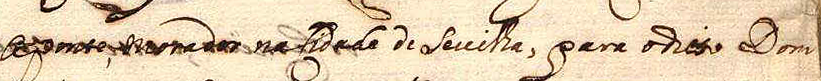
Aponte, morador na Cidade de Seuilha, para o ditto Dom
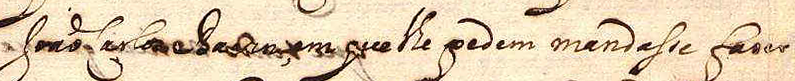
Joaõ Carlos Ba__n, em que lhe pedem mandasse faser
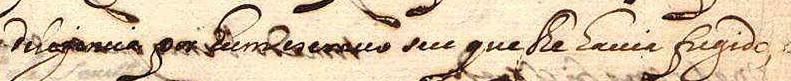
deligencia por hum escrauo seu que lhe hauia fugido,
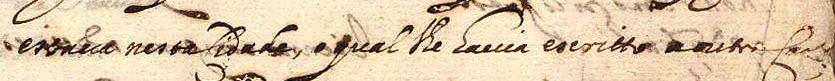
estaua nesta Cidade, o qual lhe hauia escritto a outr_ Ca
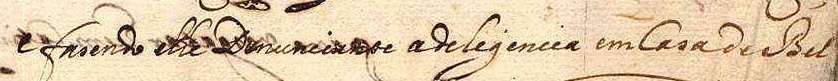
e fasendo elle Denunciante a deligencia em Casa de Bel
